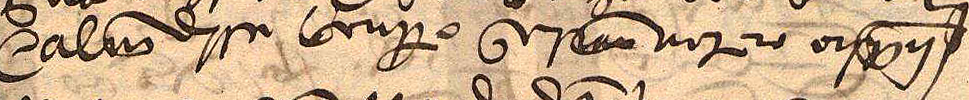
e al nō djse E eu ꝑo serrão notro o esp̄uj
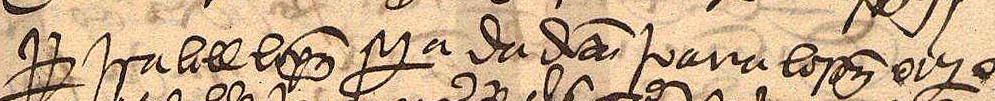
item Jsabell lop̄z fa da dita Joana lopz̄ outo
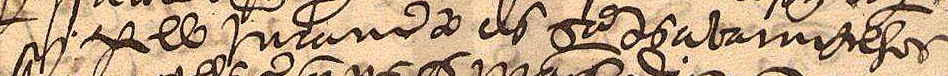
sj pello Juramēto dos sātos avamgelhos
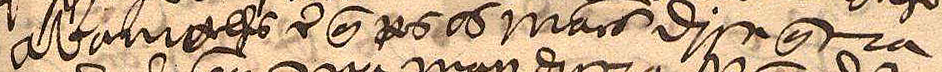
avamgelhos ē q̄ pos as mãos djse q̄ era
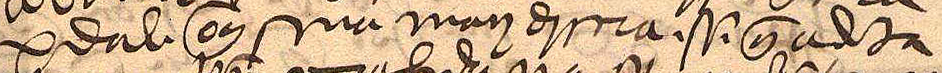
ꝟdade o q̄ sua may djsera .ss. q̄ a dita
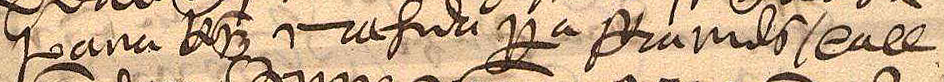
Joana Rōjz era hida ꝑa framdes / e all
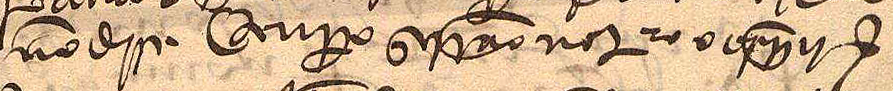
nō djse E eu ꝑo serrão notro o esp̄uj
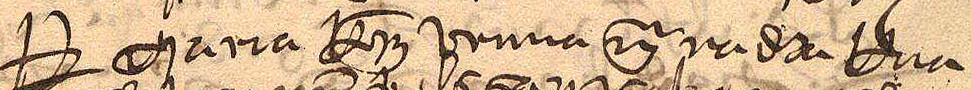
item gracia Roj̄z veuua mor na dita Rua
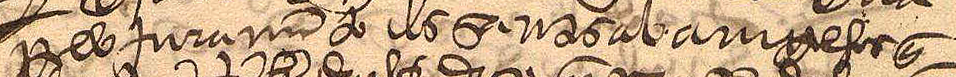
pello Juramēto dos santos avamgelhos q̄
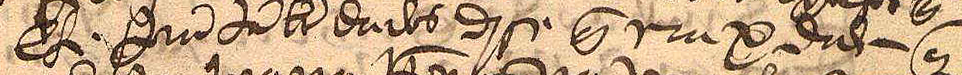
lhe forā tābē dados djse q̄ era ꝟdade q̄
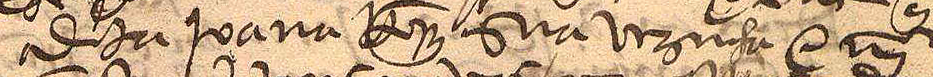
a dita Joana Rōjz sua vezinha e mor
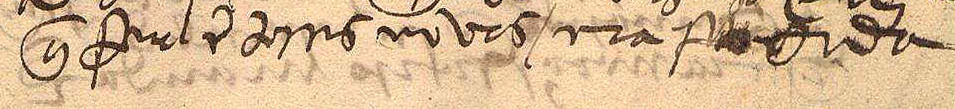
q̄ fora ē torres novas / era fogida
